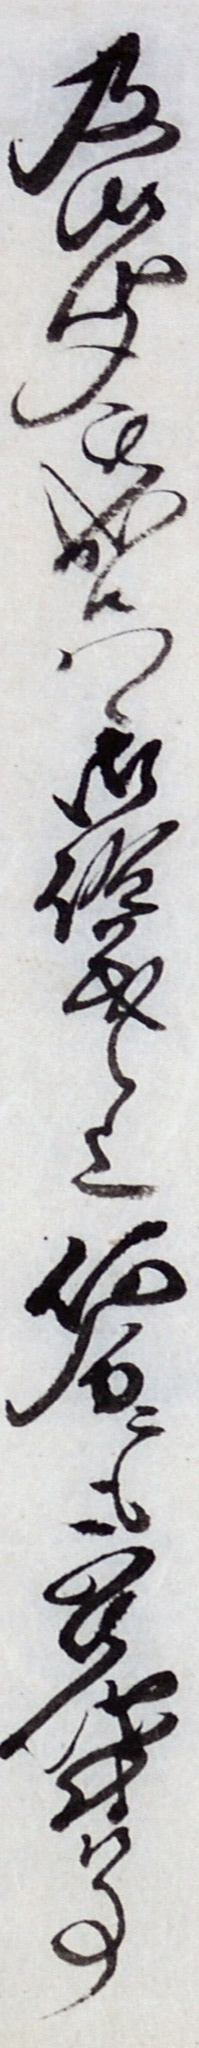及御聞被成候ハヽ御詮義之上何分ニも可被仰付候事
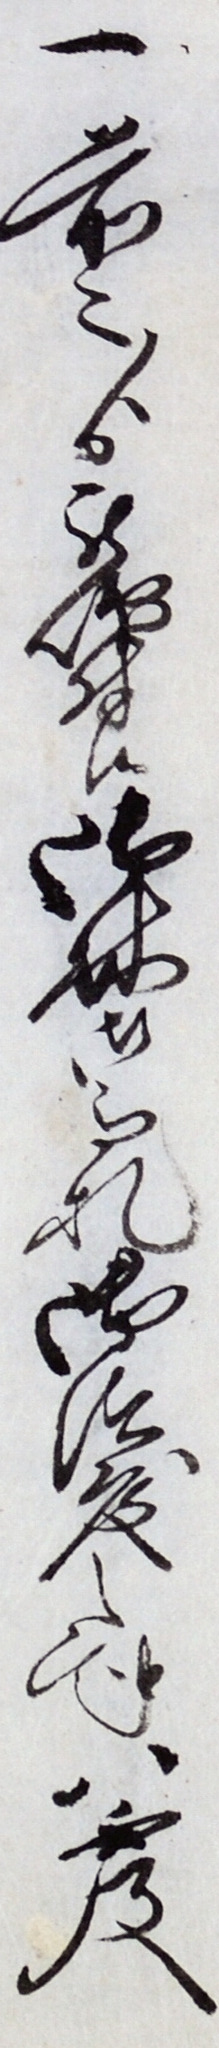一前々ゟ被仰付候御林御高札御法度之趣ハ無及
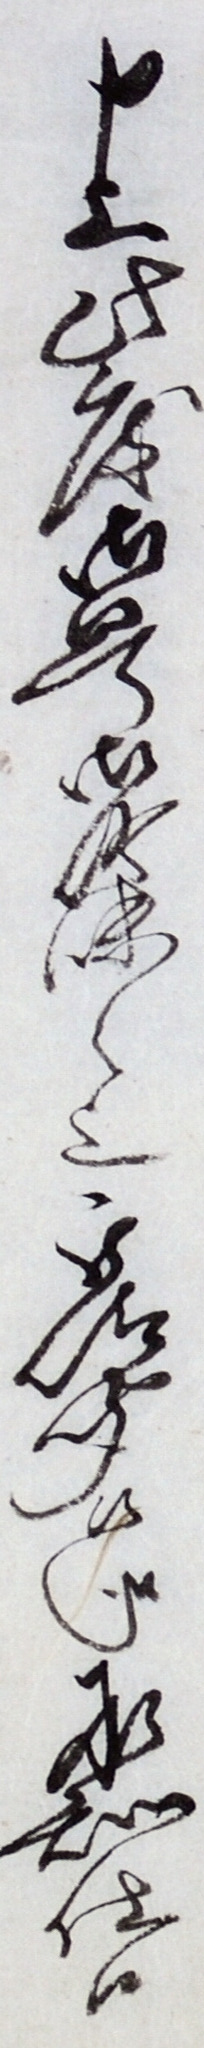申上此度御廻り御吟味之上被仰聞候趣承知仕候
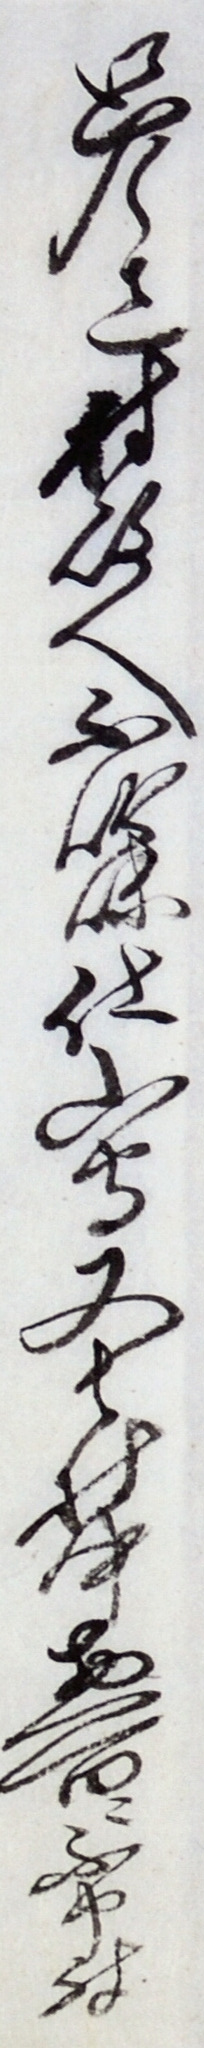只今迄村役人不吟味仕山守又は村中惣百ニ不申付
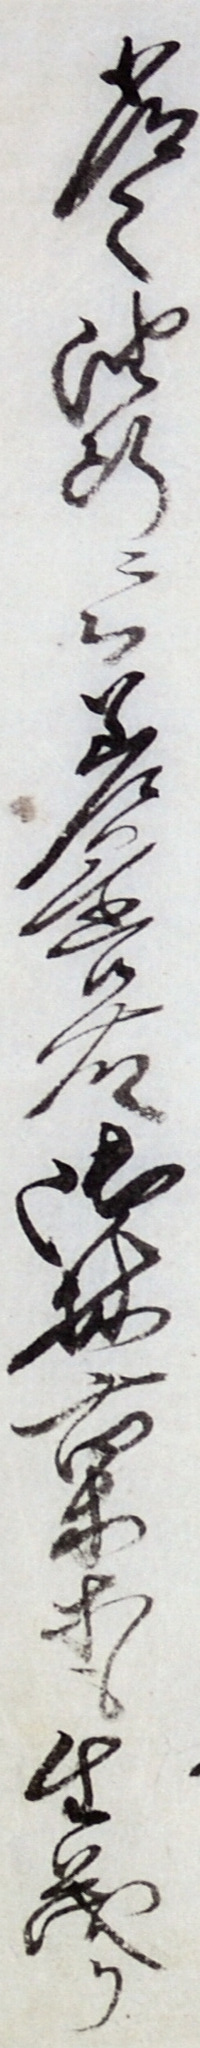常々油断ニ而差置候故御林苗木等も生茂り

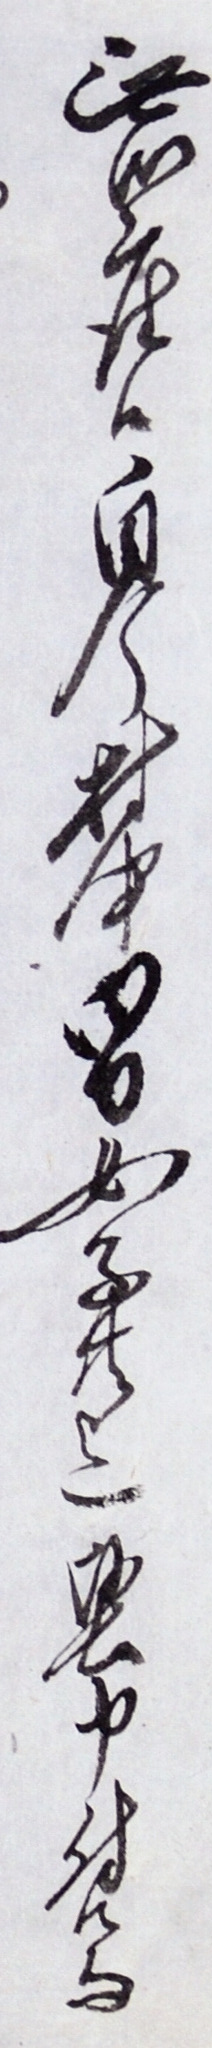無御座候自今村中男女子共迄堅申付候而
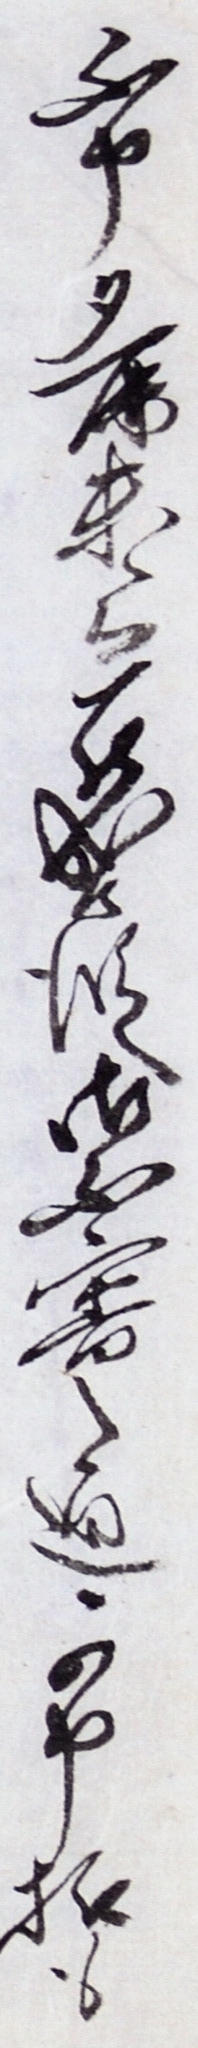不申麁末ニ而罷成候段御不審之通可申様も
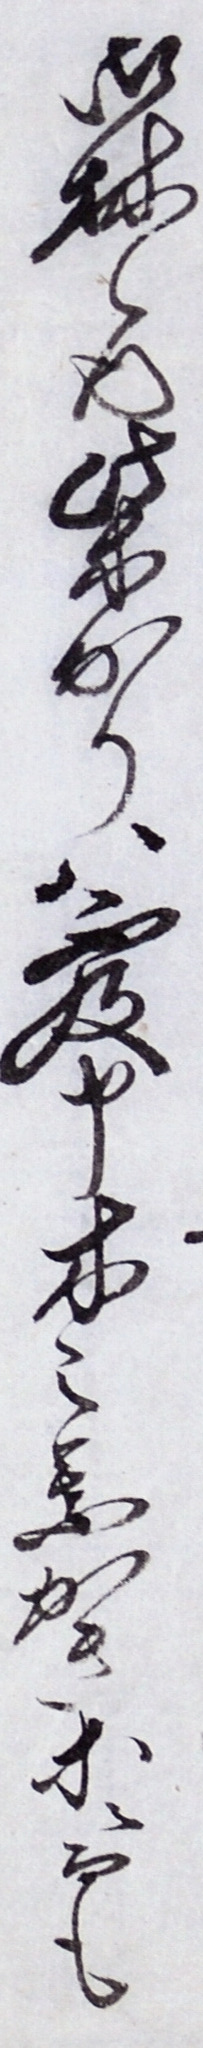御林之内柴かりハ不及申木之葉かき等ニ而も
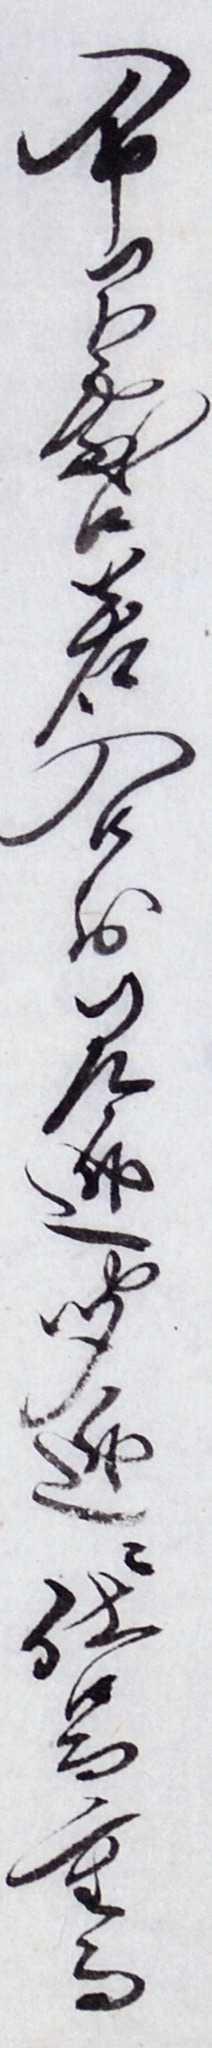入申間敷候若入候於見逃聞逃ニ仕候而重而
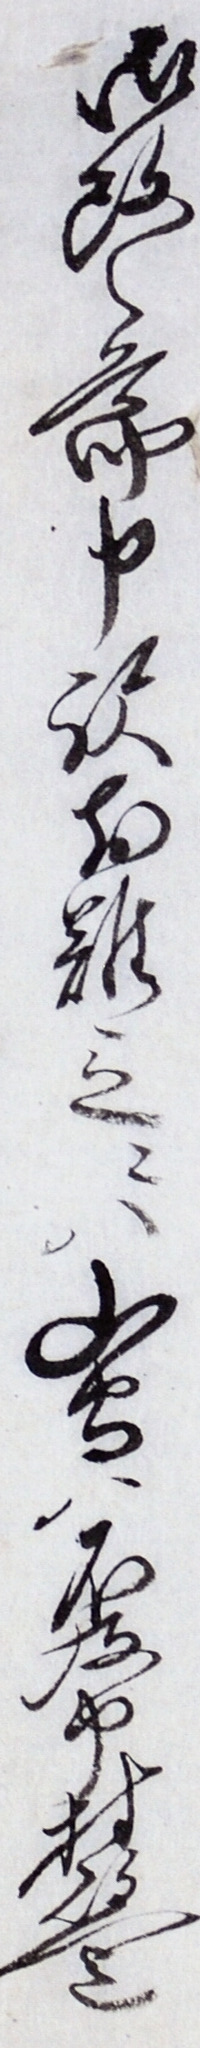御改之節申訳於難立ニハ山守ハ不及申村役人迄
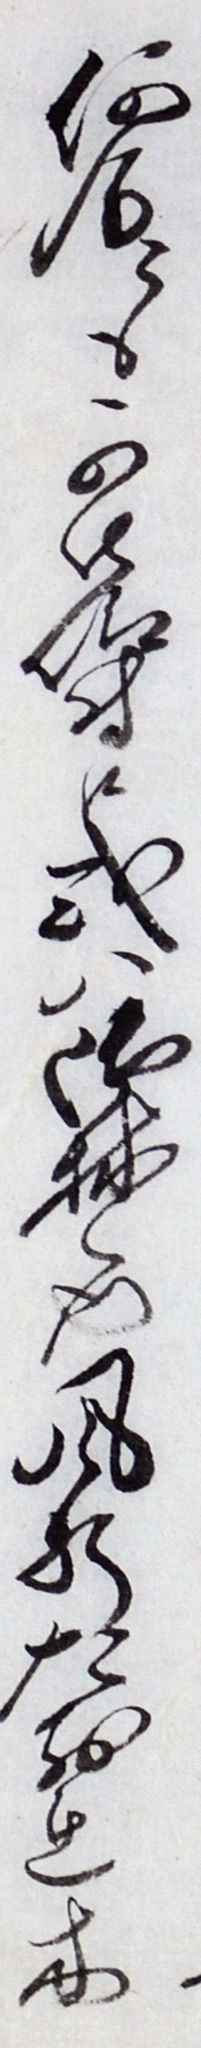何分ニも可被仰付候或ハ御林之内風折たおれ木
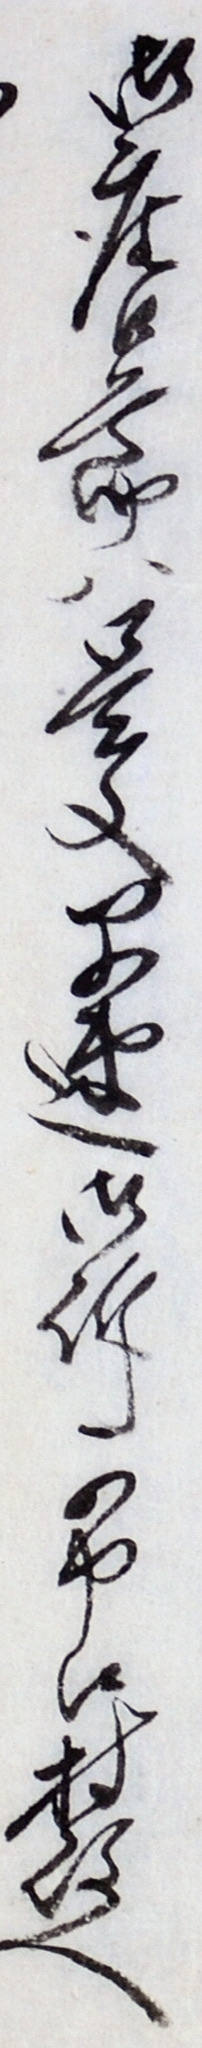御座候節ハ是又早速御訴可申候村役人
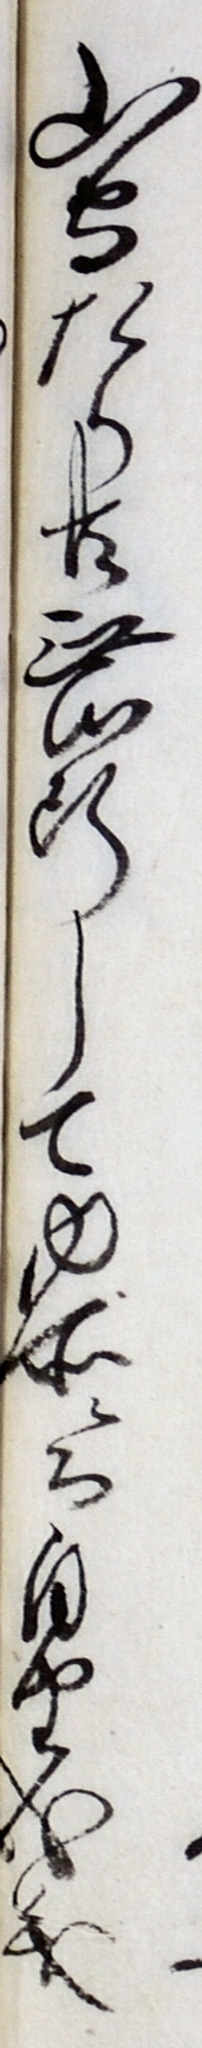山守たり共無御断して内所ニ而自由成義
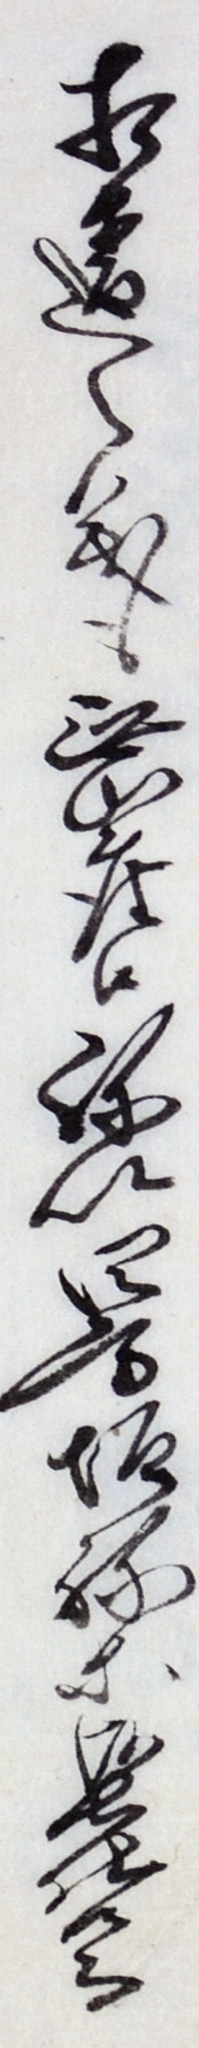相違之義も無御座候弥以四方垣ね等堅仕候而
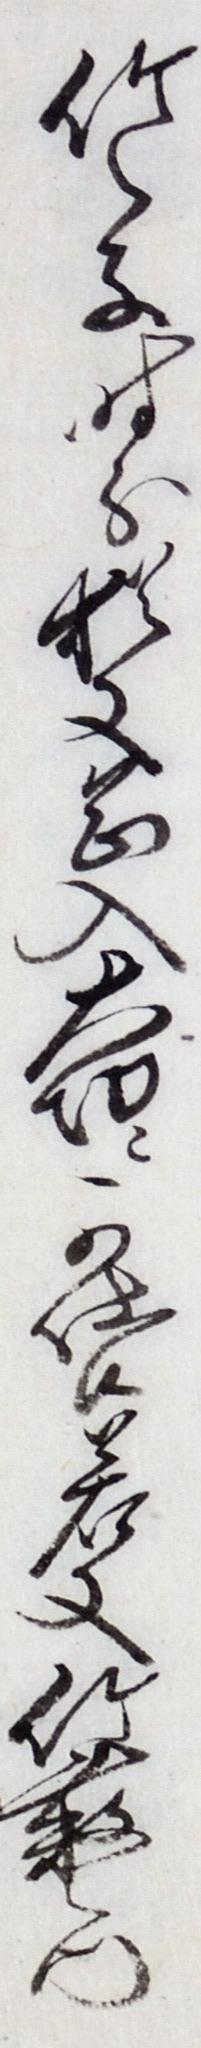竹之子時分猶又念入大切ニ可仕候若又竹薮之内
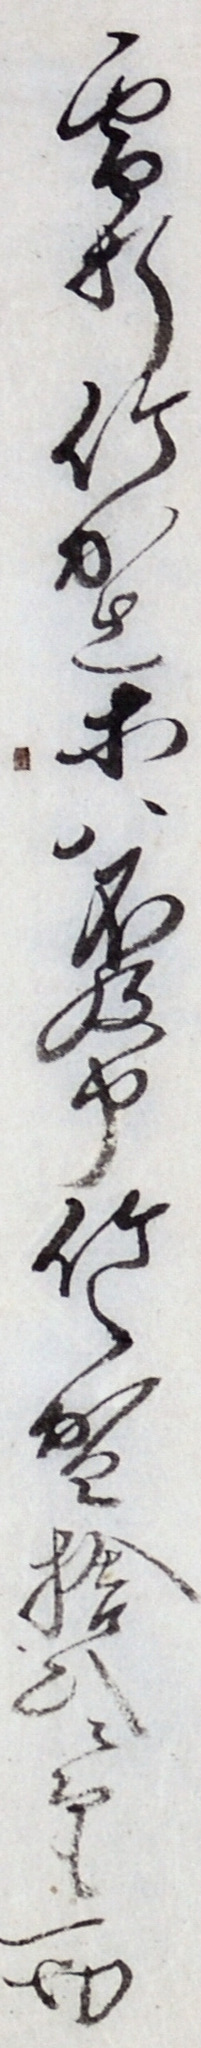雪折竹かれ木ハ不及申竹之かわ捨ひニ而も一切
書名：御林御竹藪証文控
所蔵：伊那市立高遠町図書館・合同会社AMANE
